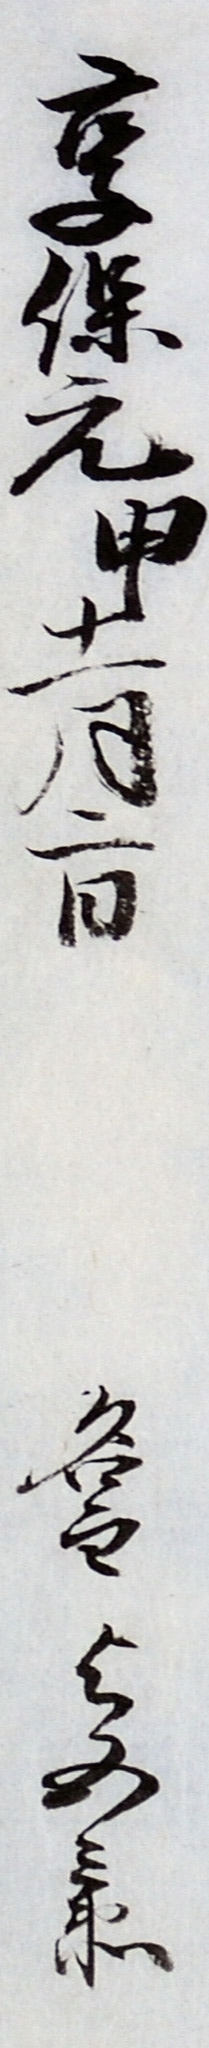享保元申十一月二日名主与五兵衛
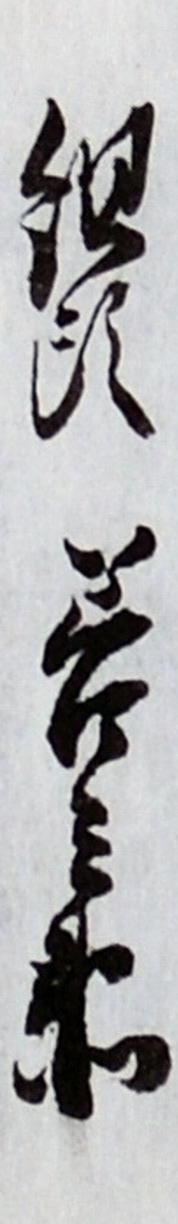組頭善兵衛
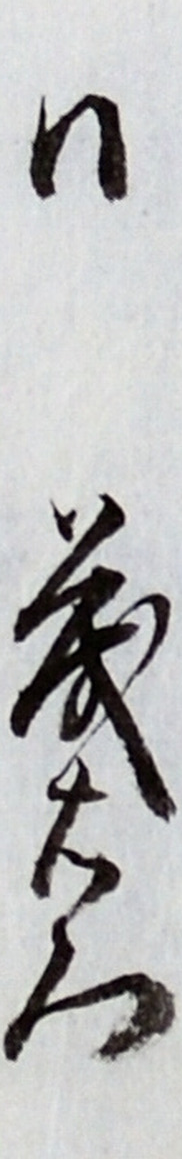同茂右衛門
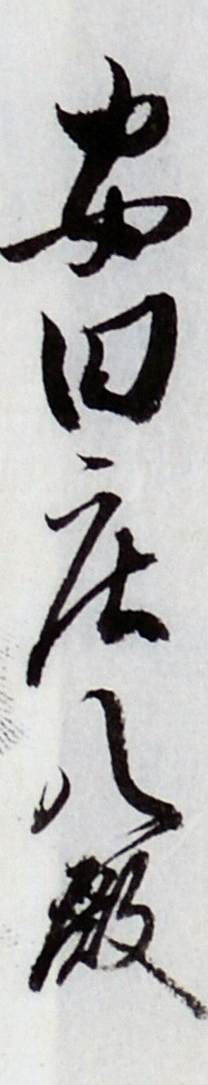安田庄八殿
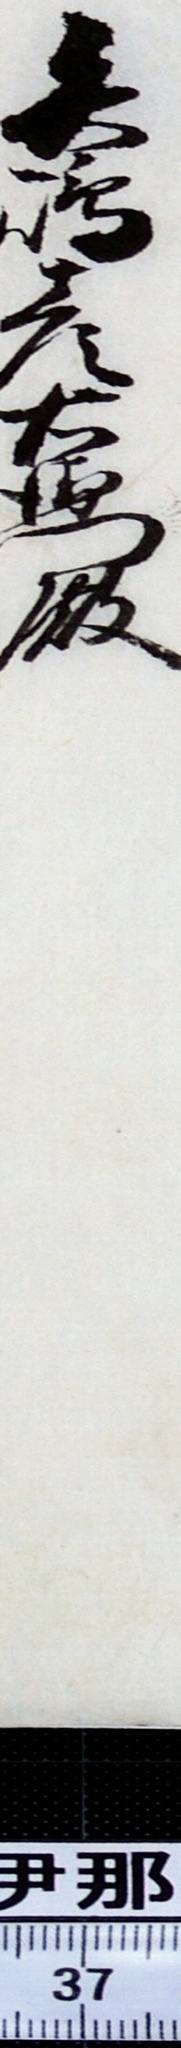矢嶋彦右衛門殿
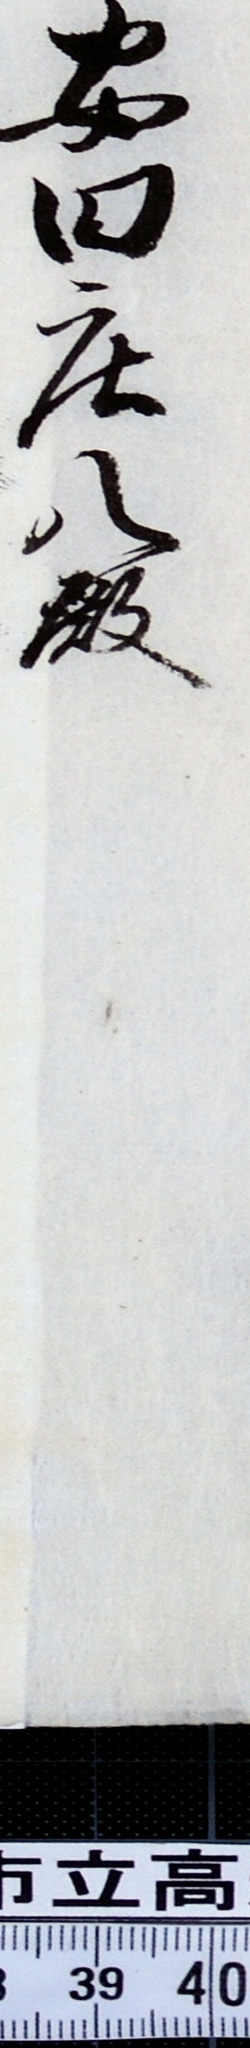安田庄八殿
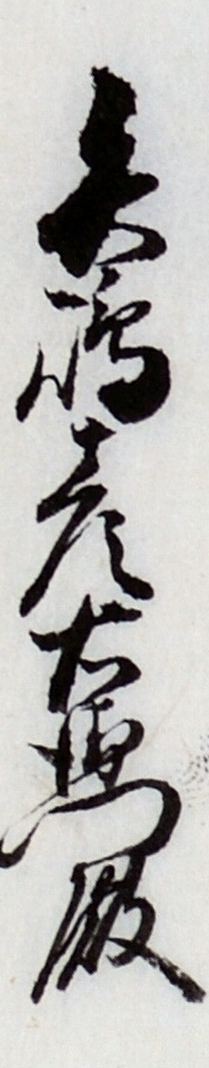矢嶋彦右衛門殿

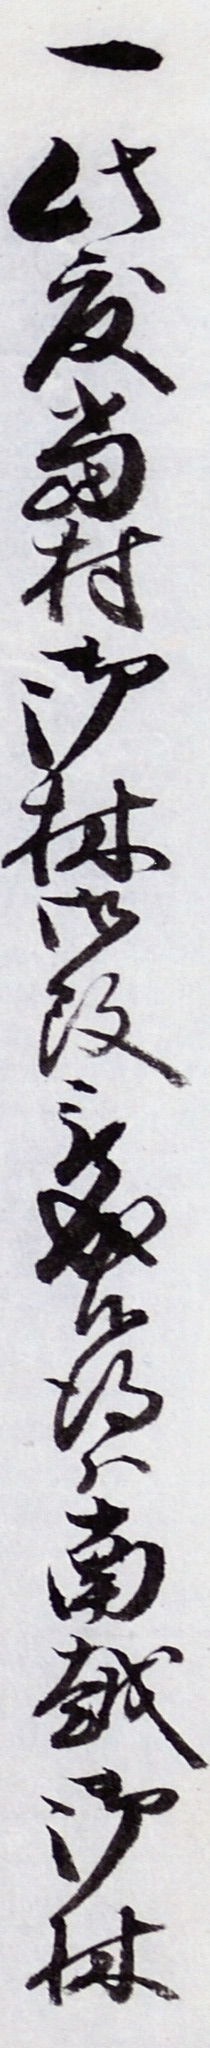一此度当村御林御改被成候得ハ南越御林
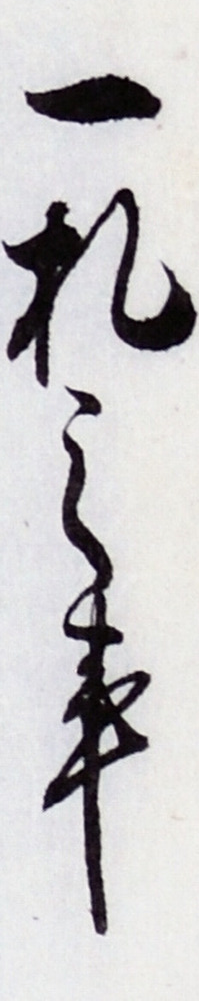一札之事
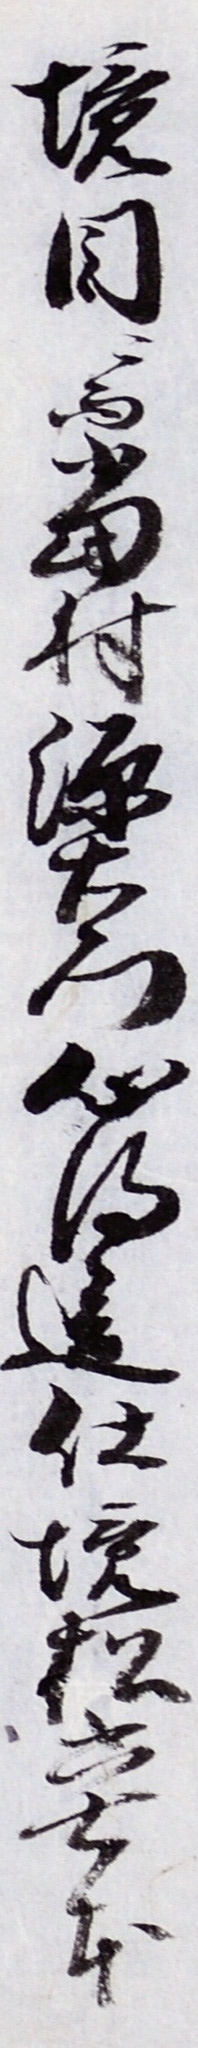境目ニ而当村源右衛門心得違仕境松六七本
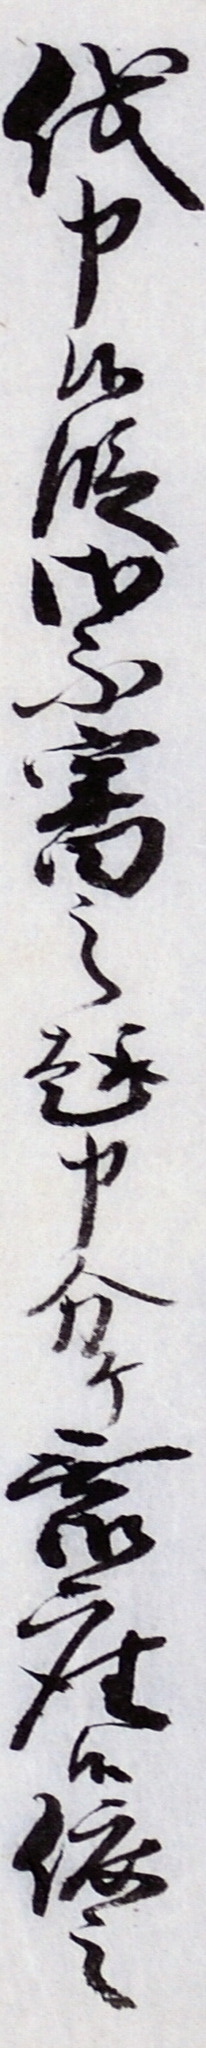伐申候段御不審之趣申分ヶ無御座候依之
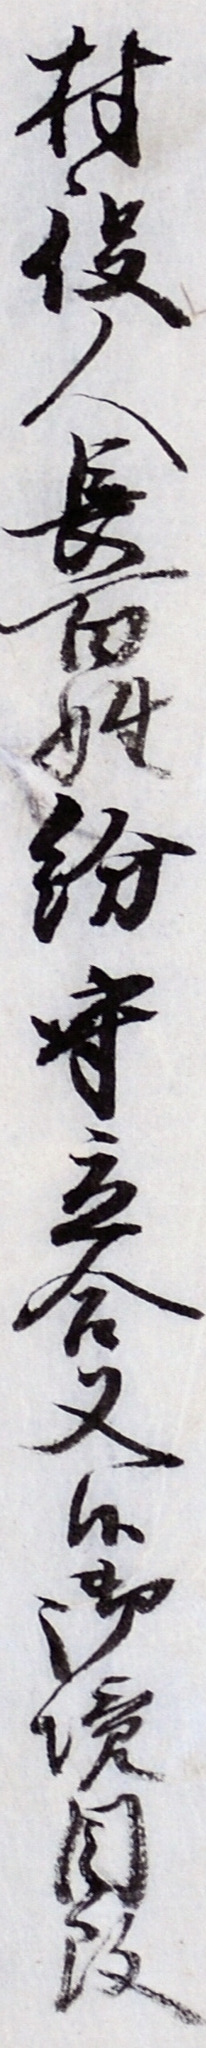村役人長百姓紛守立合又候御境目改
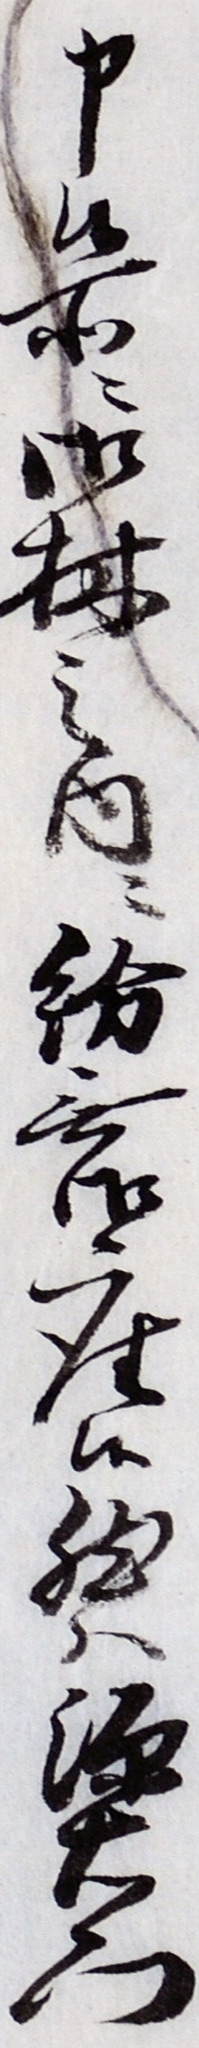申候所ニ御林之内ニ紛無御座候然ハ源右衛門
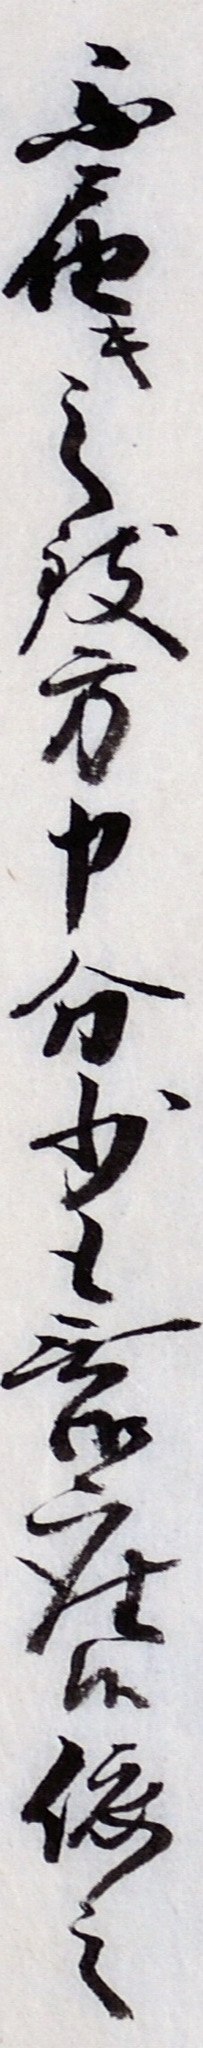不届キ之致方申分少も無御座候依之
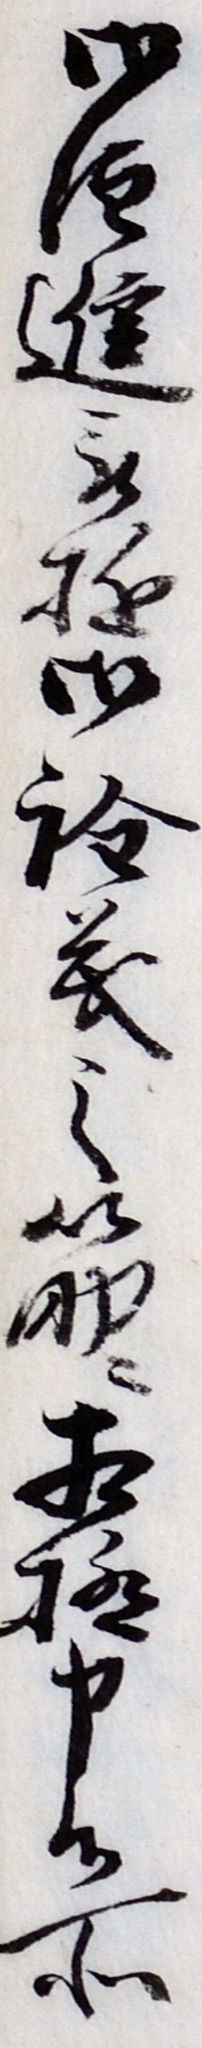御注進被遊御詮義之筋ニ相極申候所
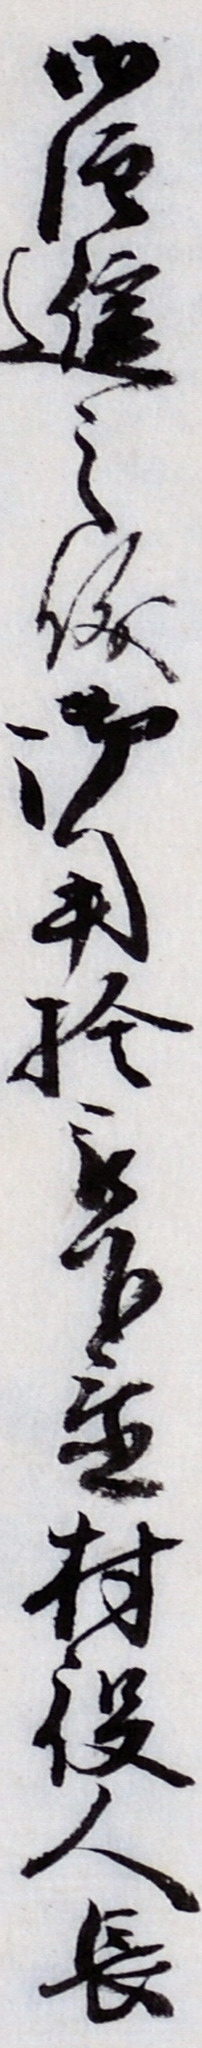御注進之儀御用捨被下置村役人長
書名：御林御竹藪証文控
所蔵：伊那市立高遠町図書館・合同会社AMANE
